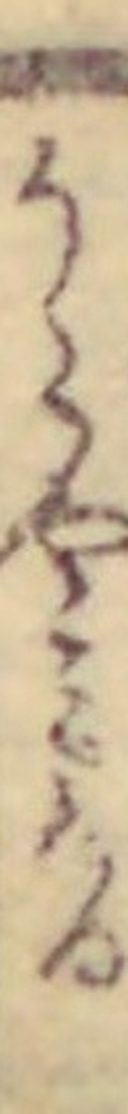うらやみける
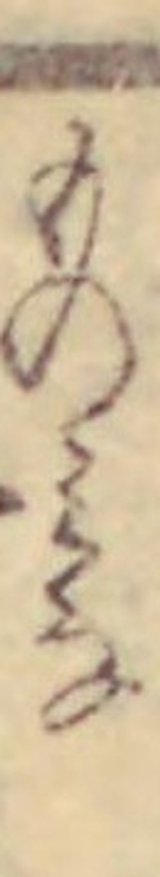ものみな
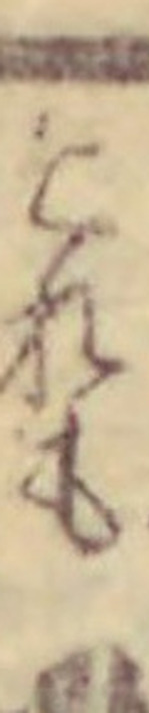これも
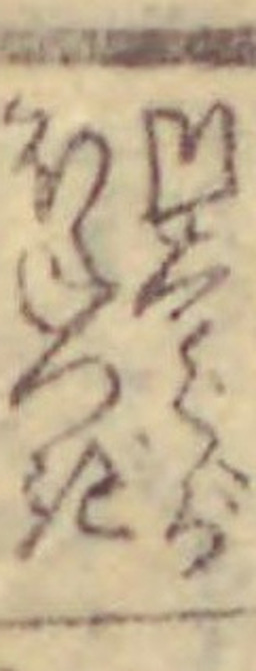ほねつき
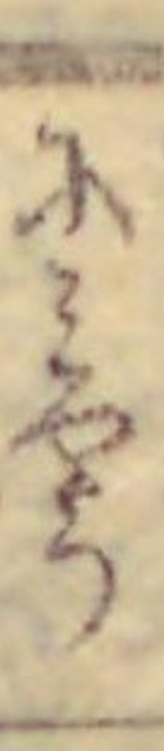にみやう
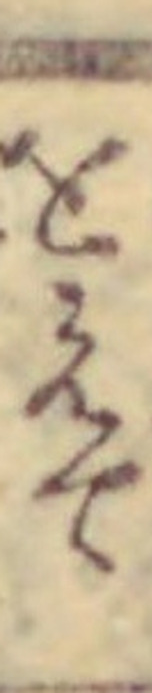をえて
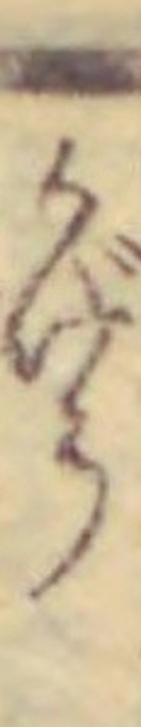かげう
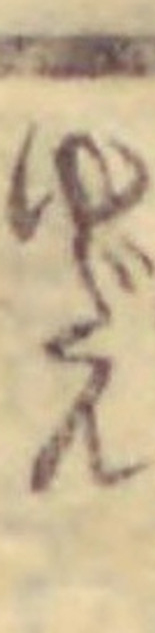ゆだん
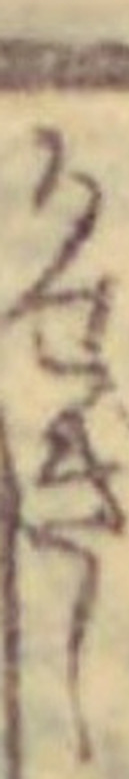かせぎし
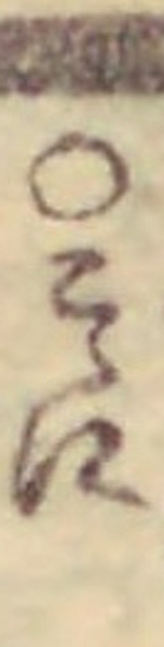○こゝに
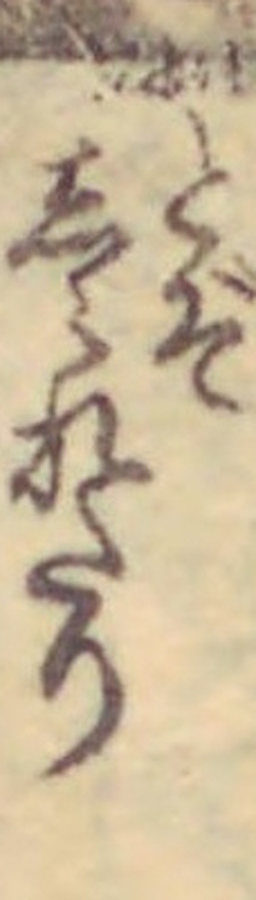しられたり
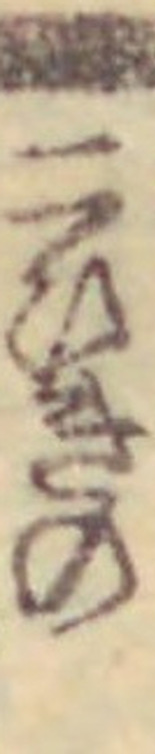二ひきの
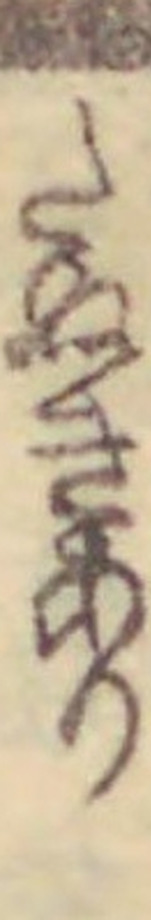たぬきあり
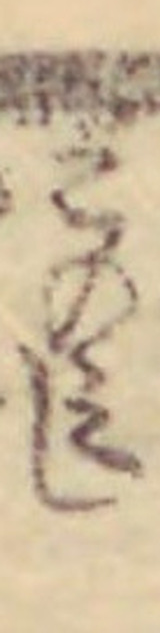このみし
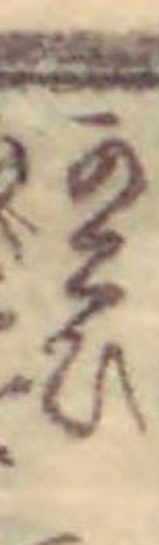かこひ

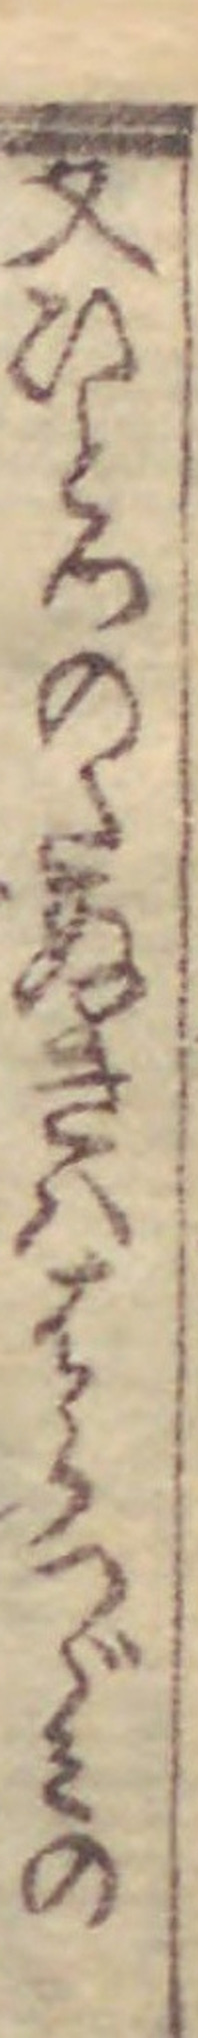又ひとつのたぬきははらつゞみの
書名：化物世帯氣質
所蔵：国立国会図書館 National Diet Library, JAPAN
